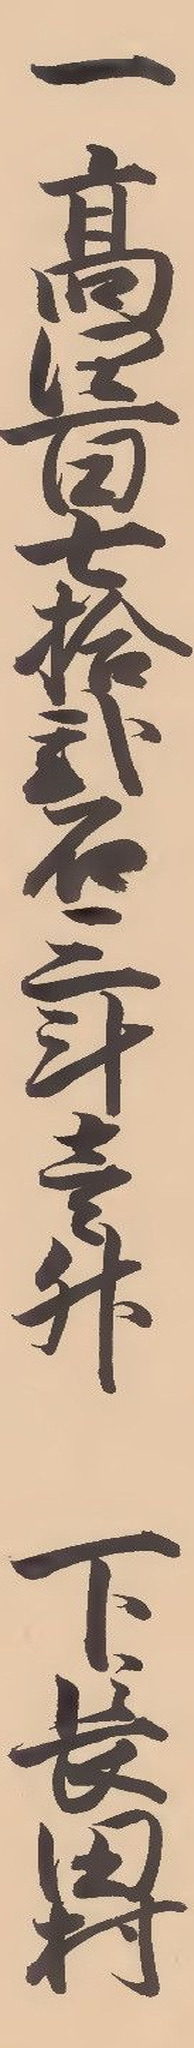一高四百七拾弐石三斗壱升下長田村
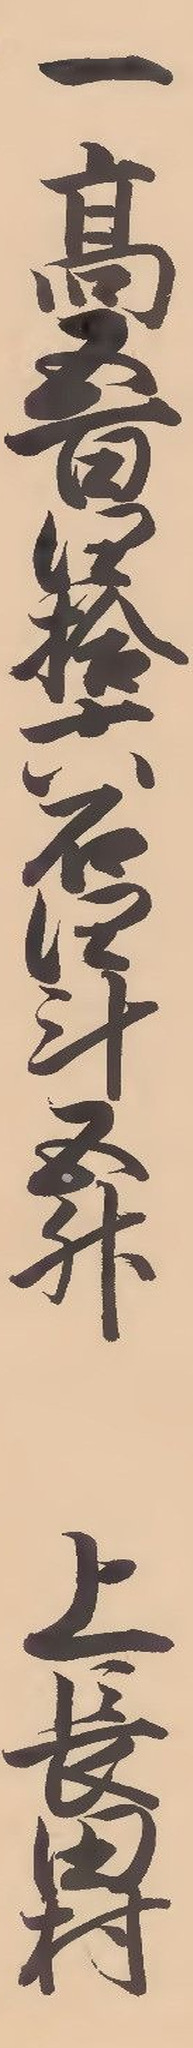一高五百四拾六石四斗五升上長田村

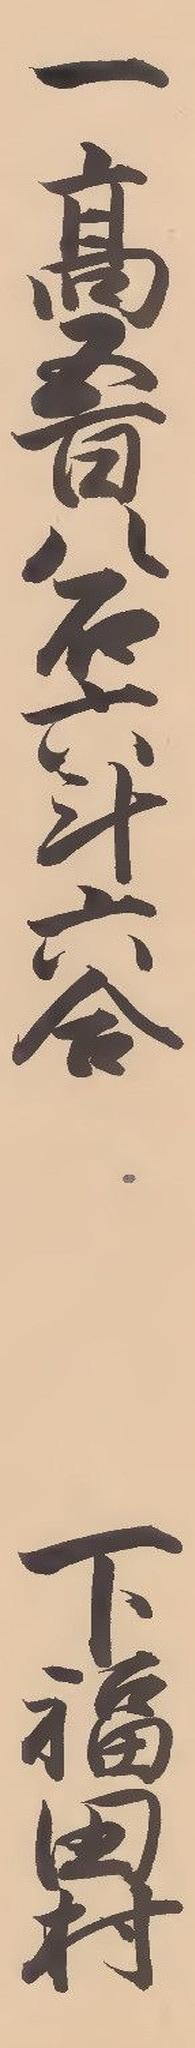一高五百八石六斗六合下福田村
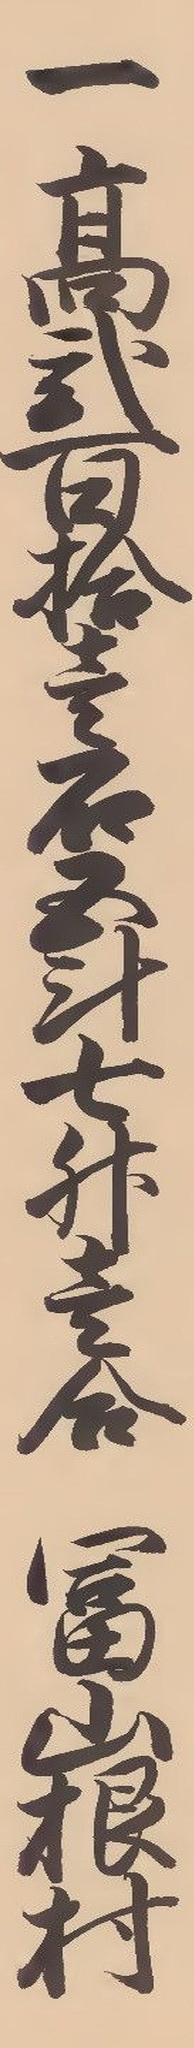一高弐百拾壱石五斗七升壱合富山根村
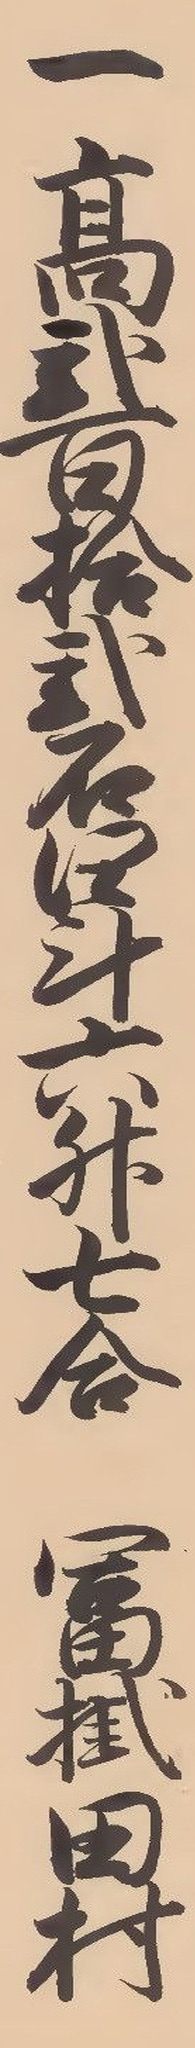一高弐百拾弐石四斗六升七合富掛田村
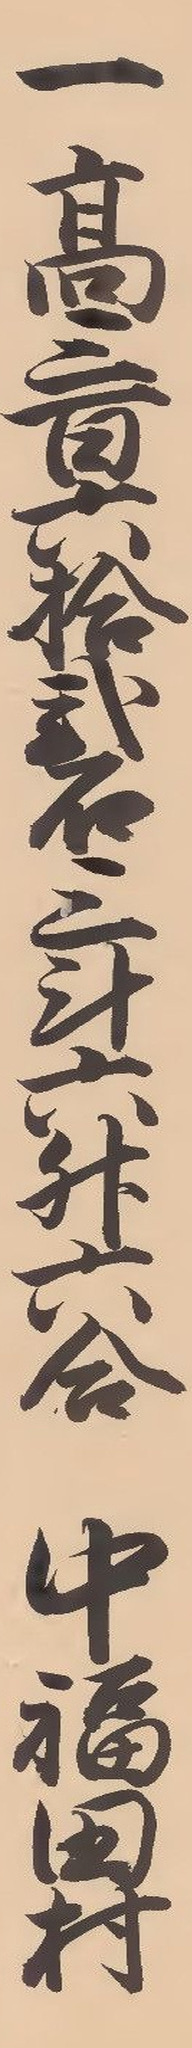一高三百六拾弐石三斗六升六合中福田村
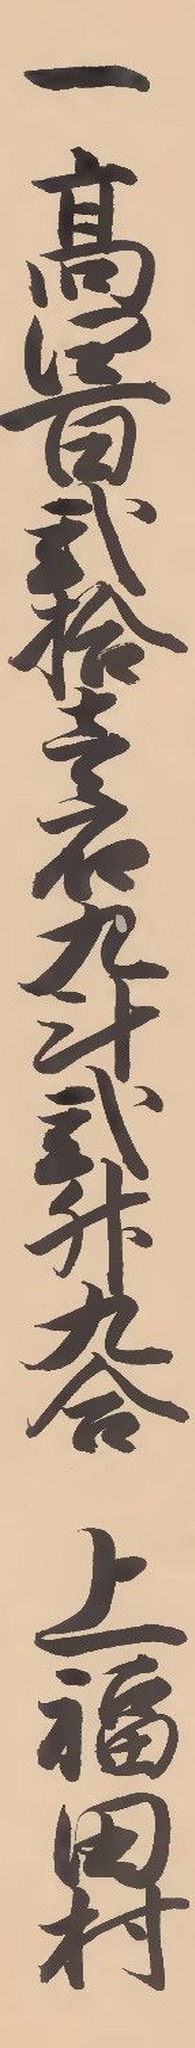一高四百弐拾壱石九斗弐升九合上福田村
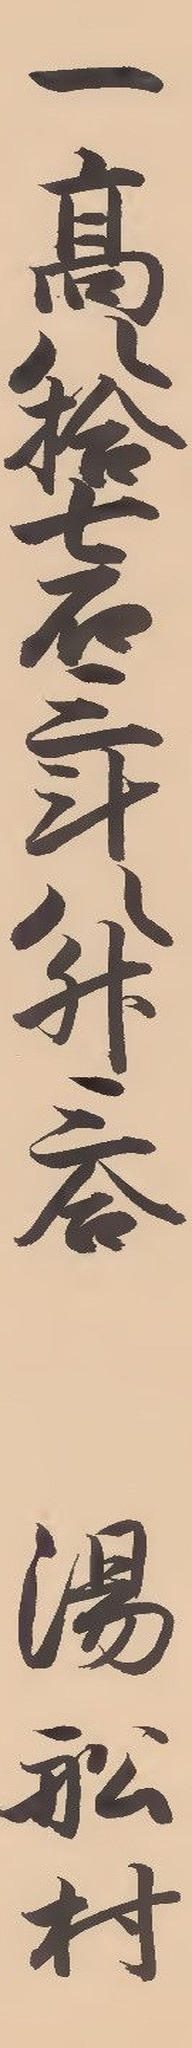一高八拾七石三斗八升三合湯船村
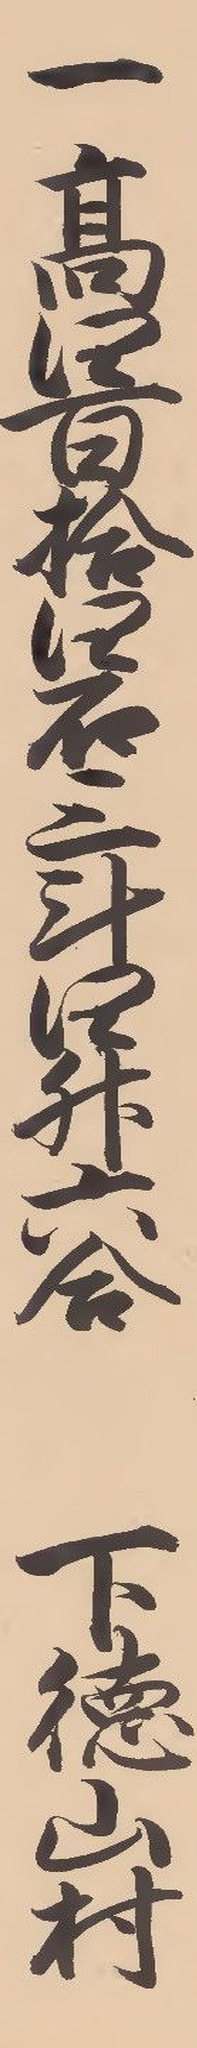一高四百拾四石三斗四升六合下徳山村
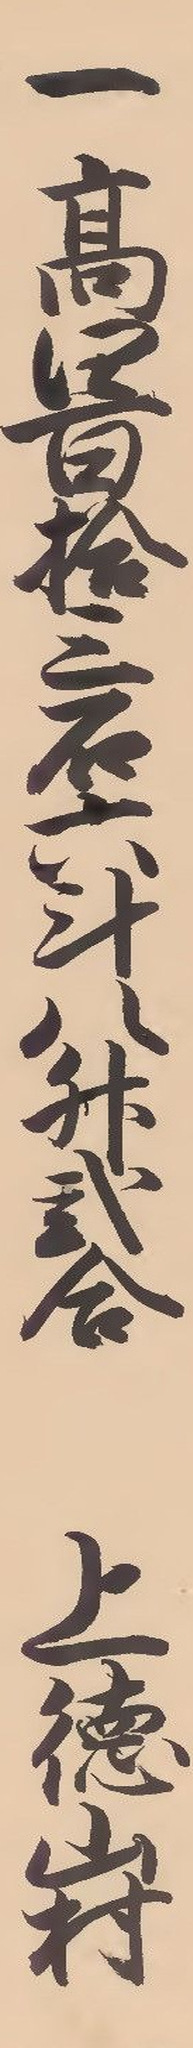一高四百拾三石六斗八升弐合上徳山村

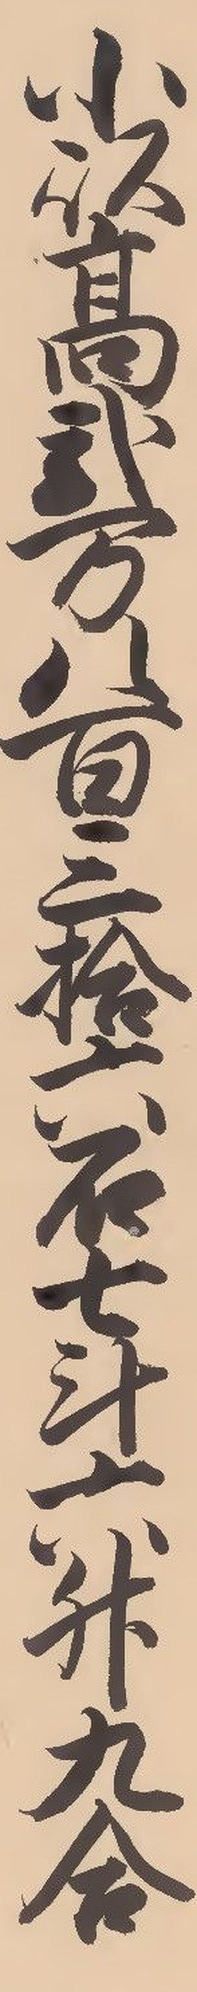小以高弐万八百三拾六石七斗六升九合
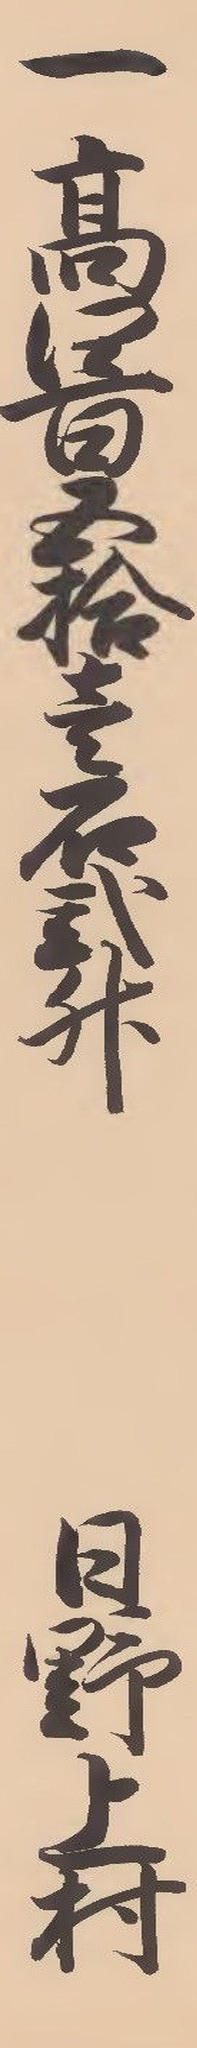一高四百五拾壱石弐升日野上村
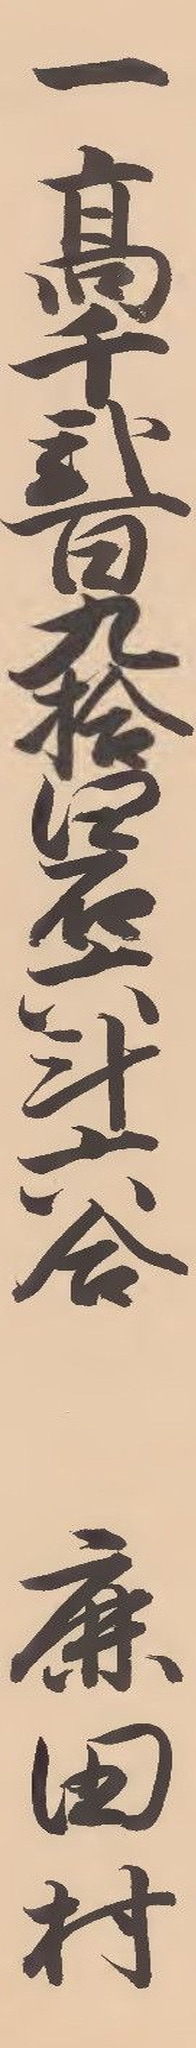一高千弐百九拾四石六斗六合鹿田村
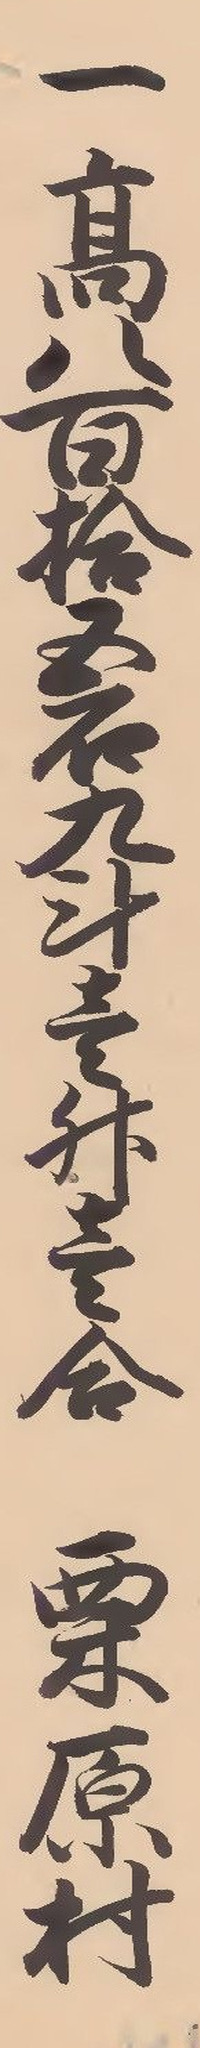一高八百拾五石九斗壱升壱合栗原村

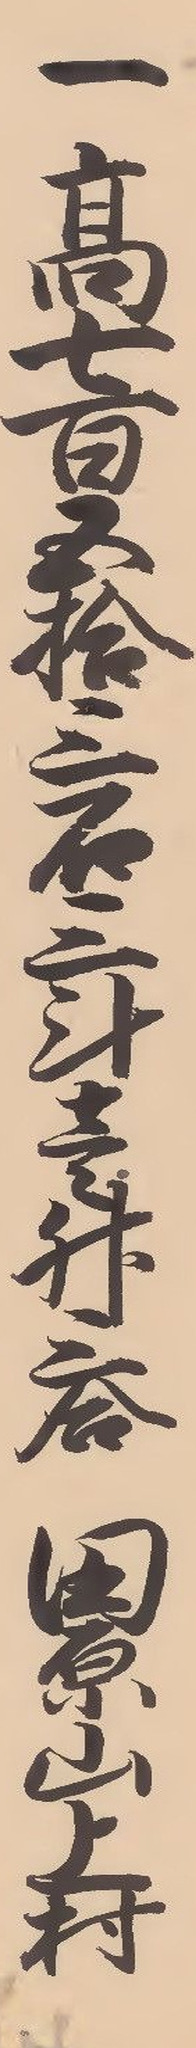一高七百五拾三石三斗壱升三合田原山上村
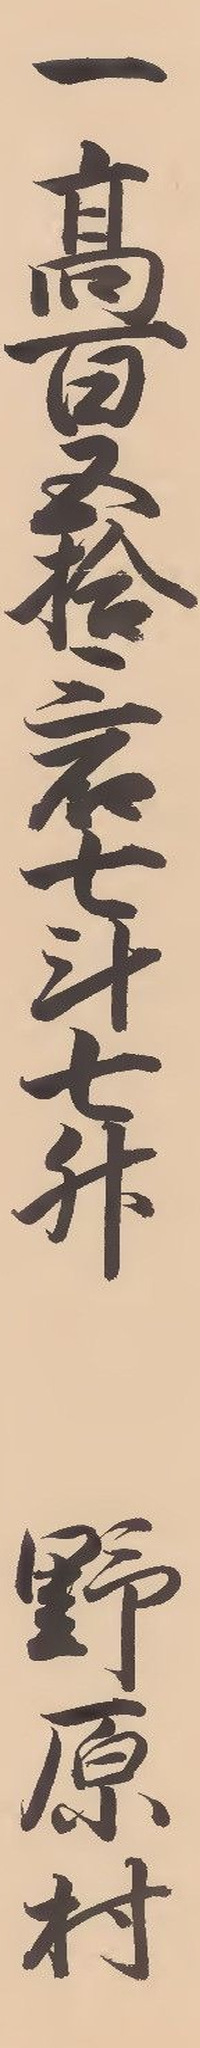一高百五拾三石七斗七升野原村
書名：美作国郷帳
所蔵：国立公文書館 National Archives of Japan
